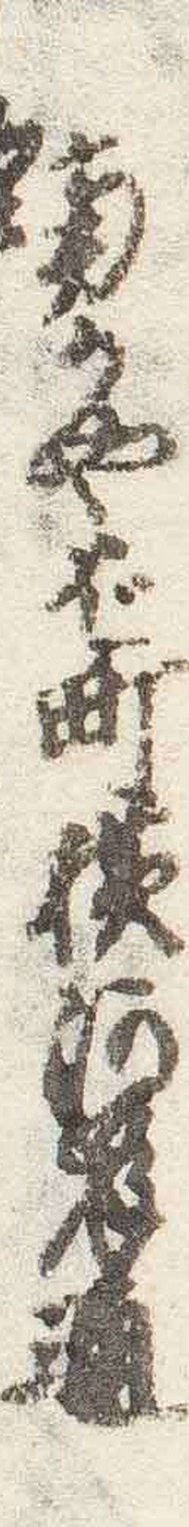南かやば町横河岸通
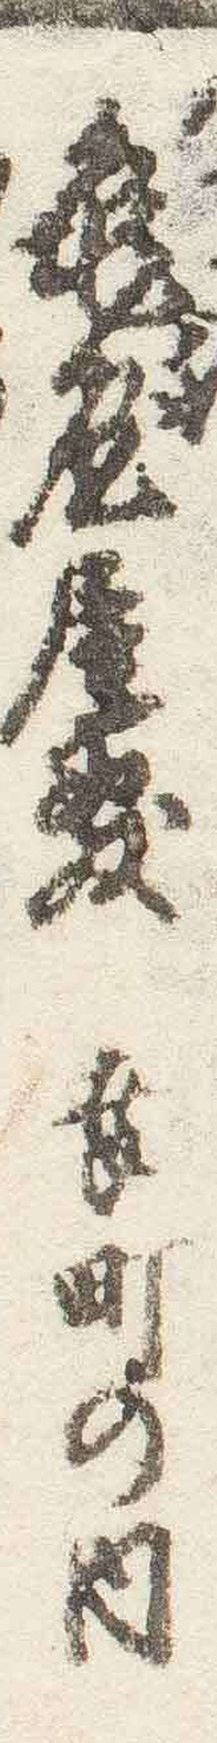亀屋屋敷幸町の内
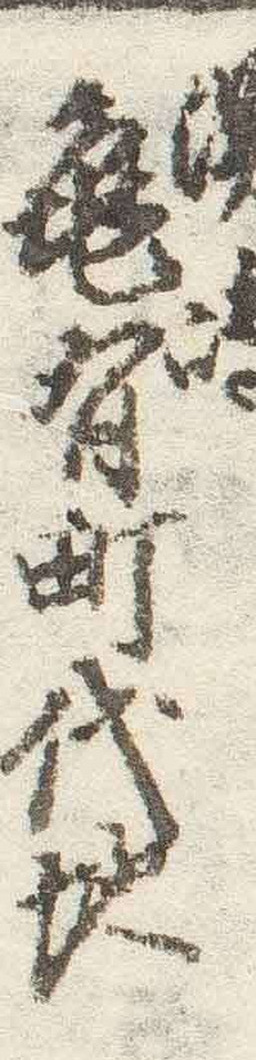亀有町代地
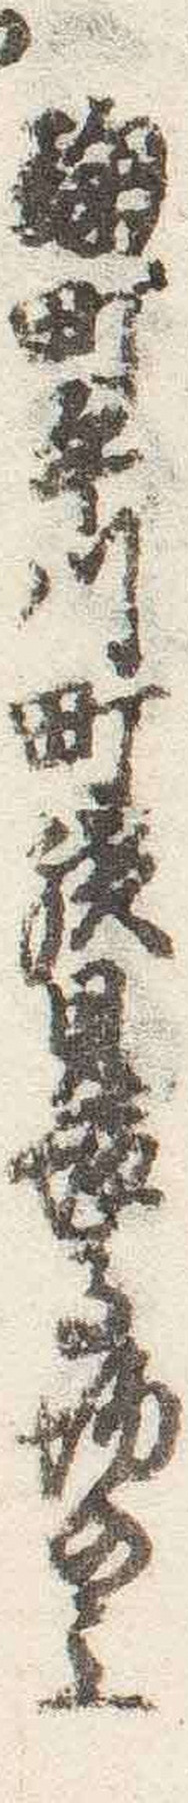麹町平川町続貝坂馬場の上
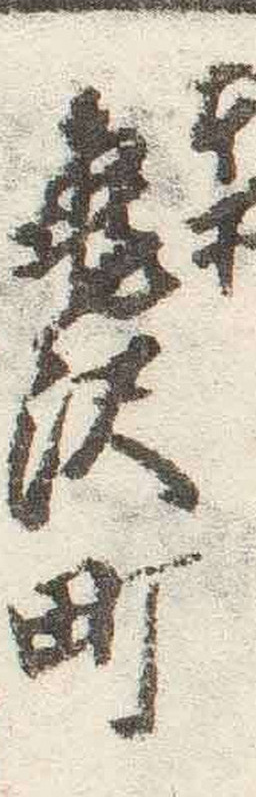亀沢町
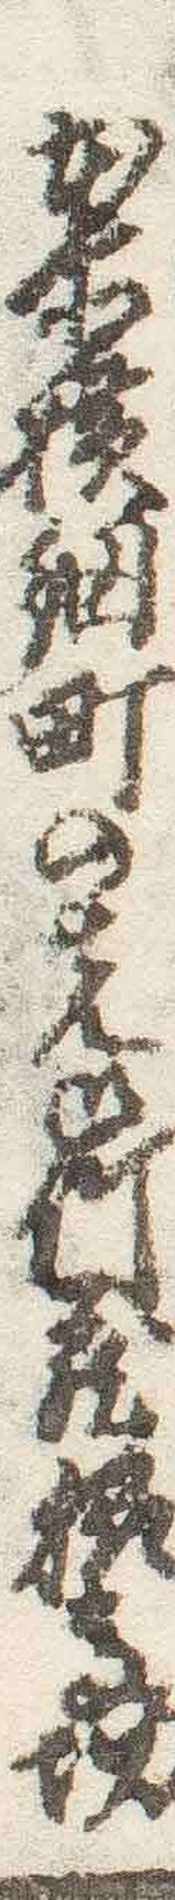本所横網町の先御竹蔵脇馬場
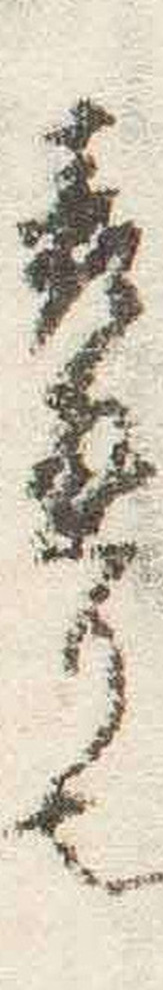表通り也
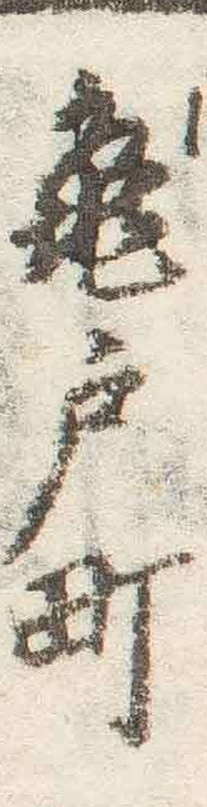亀井町
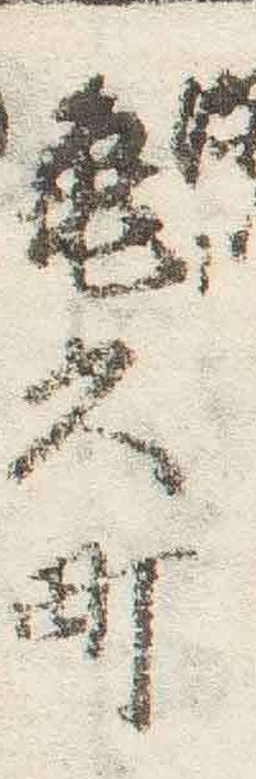亀井町

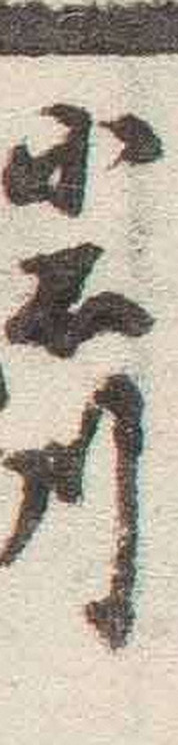小石川
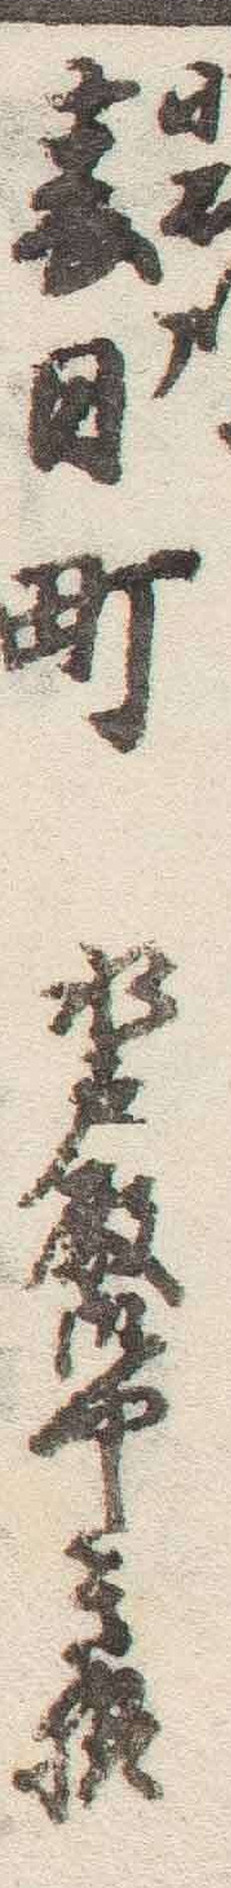春日町水戸殿御やしき脇
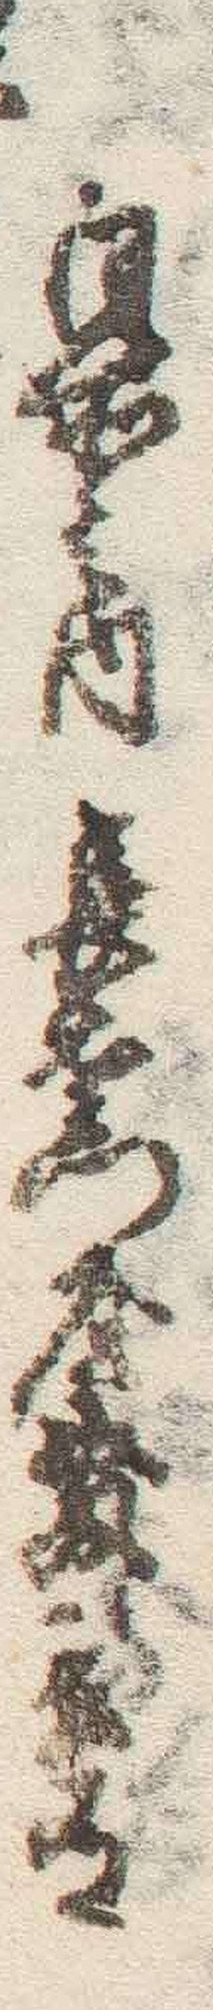同所之内長右衛門屋敷と云有
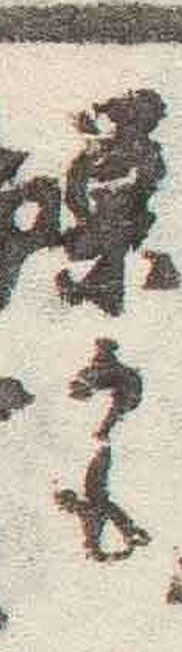巣かも
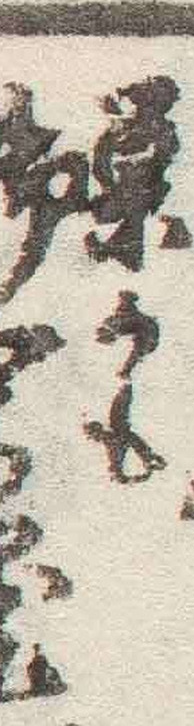巣かも
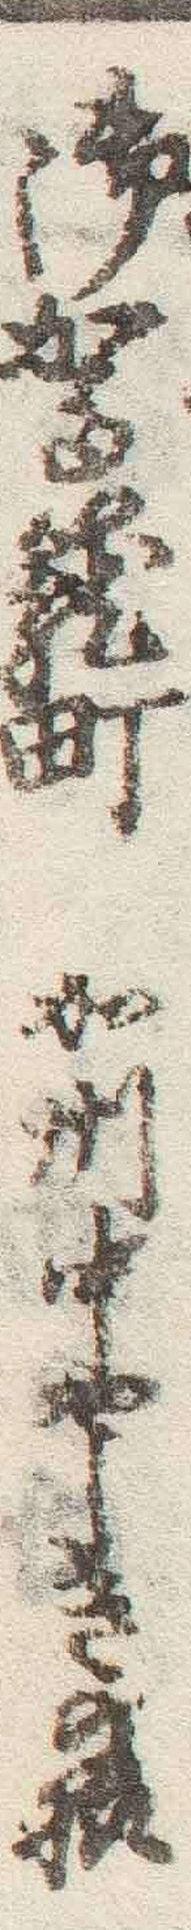御駕籠町加州中やしきの脇
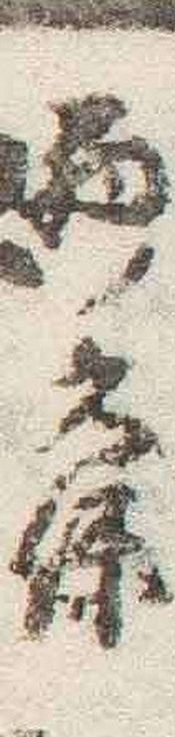西ノ久保
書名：江戸町独案内
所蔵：東京学芸大学附属図書館 国文学研究資料館
